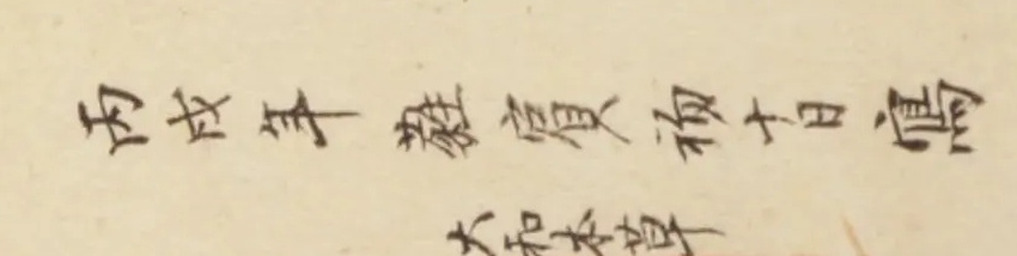丙戌年蕤賓初十日寫
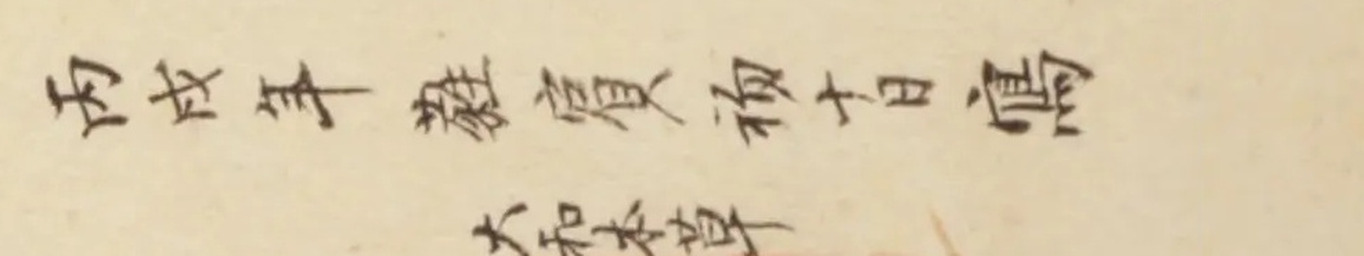丙戌年蕤賓初十日寫

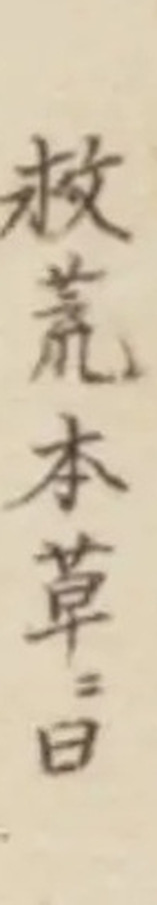救荒本草に曰
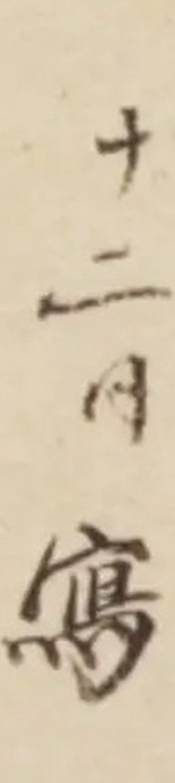十二日寫

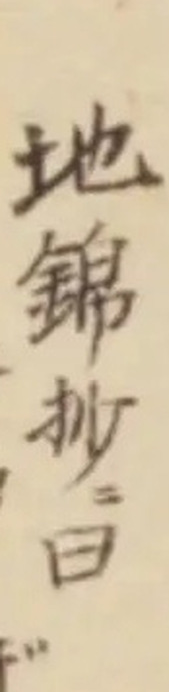地錦抄に曰
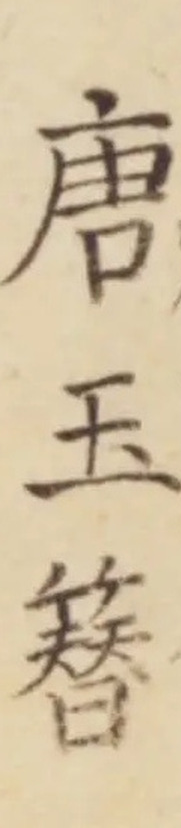唐玉簪
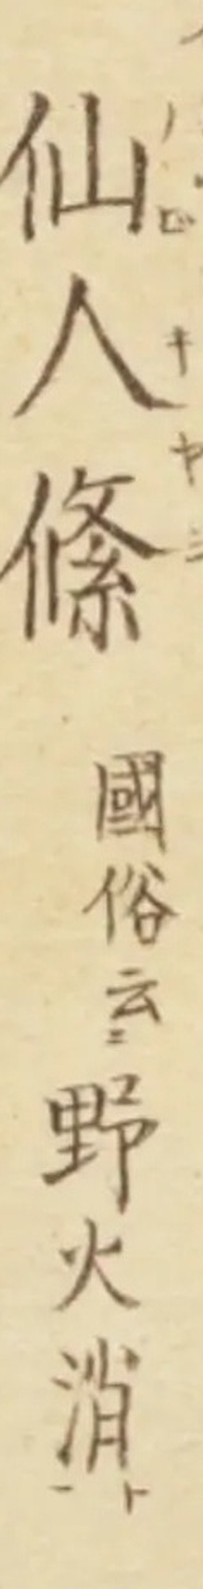仙人條国俗云野火消と
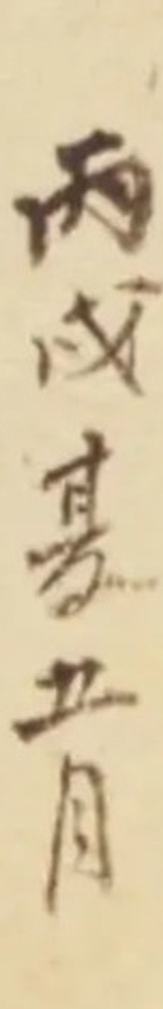丙戌夏五月
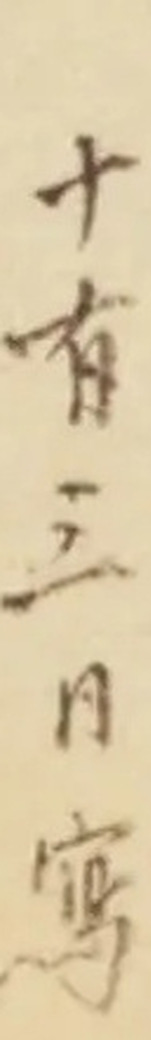十有三日寫
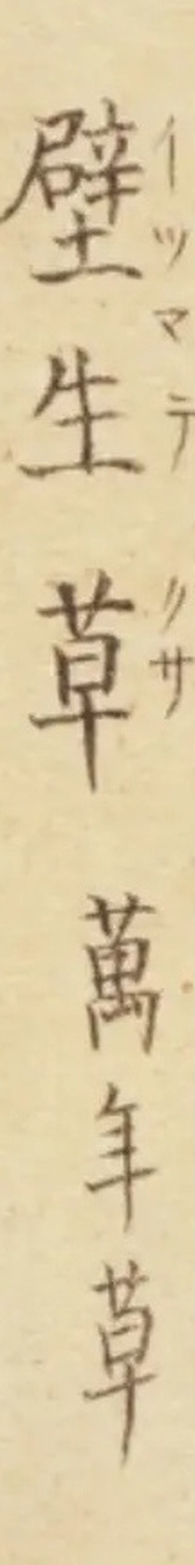壁生草萬年草
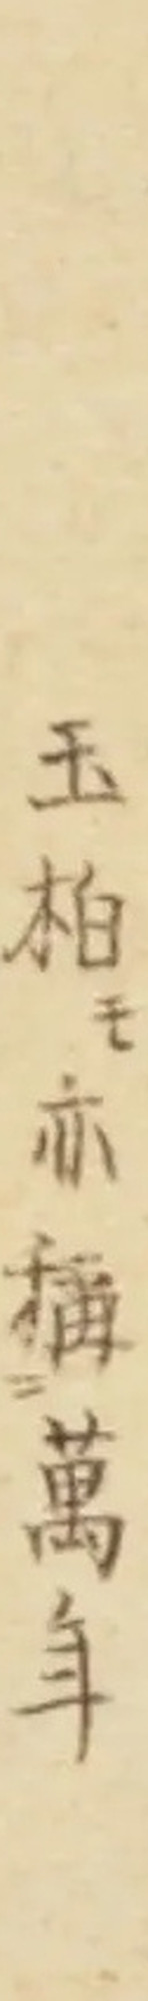玉柏も亦稱萬年
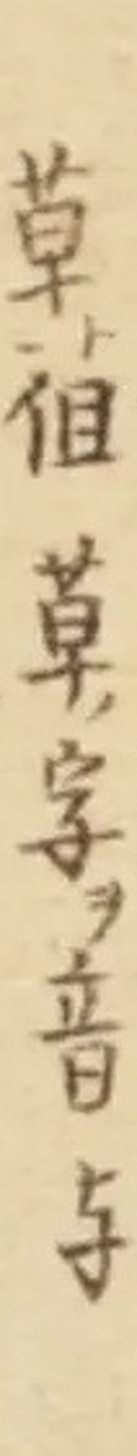草と但草の字を音与
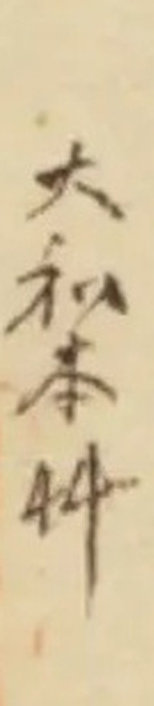大和本草
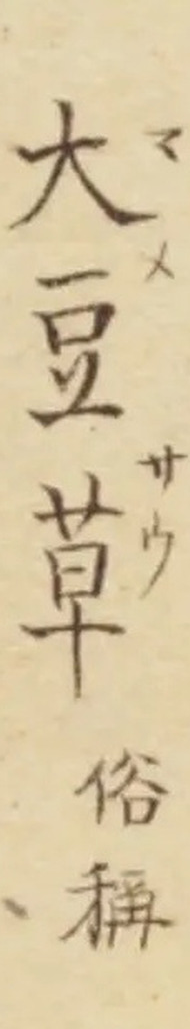大豆草俗稱
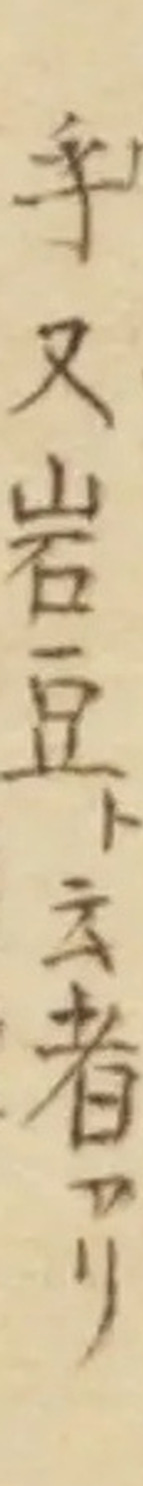乎又岩豆と云者あり

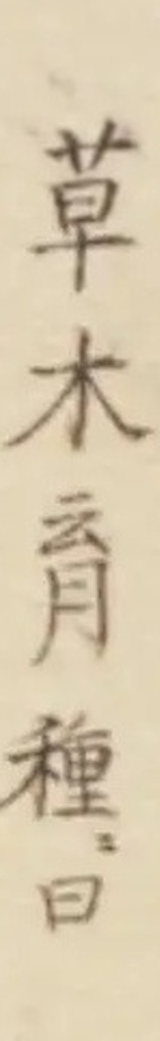草木育種に曰
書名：梅園草木花譜夏之部. 3
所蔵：国立国会図書館 National Diet Library, JAPAN
